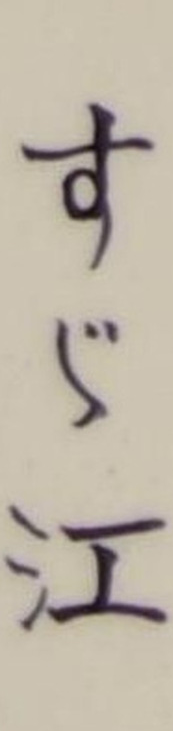すゞ江
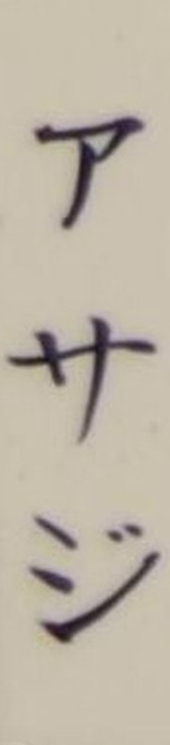アサジ

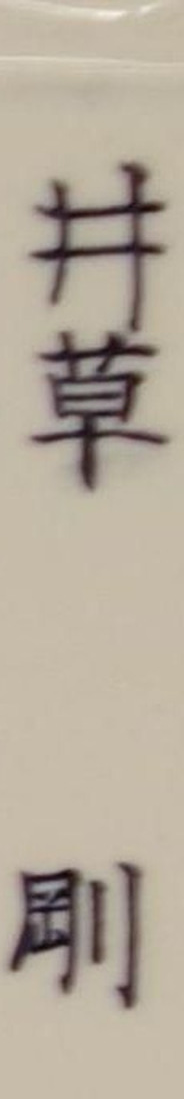井草剛
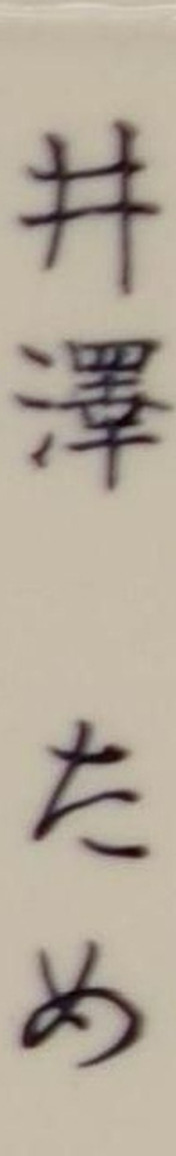井沢ため
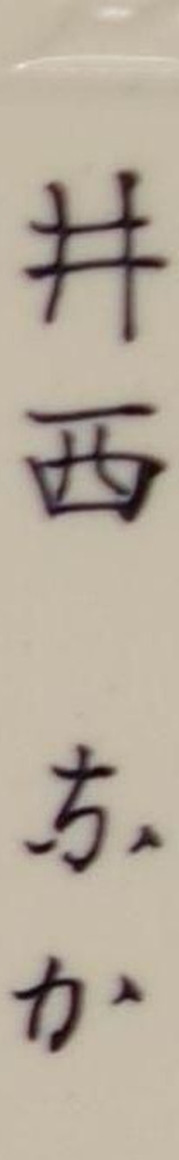井西なか
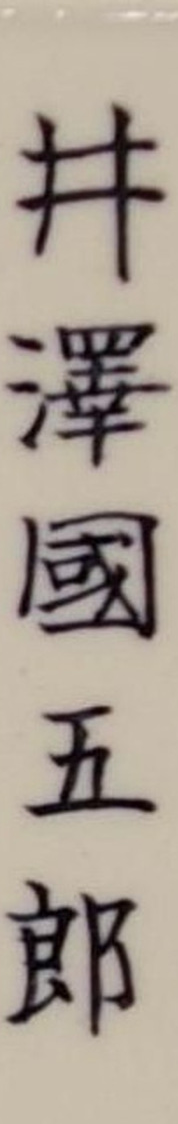井澤國五郎
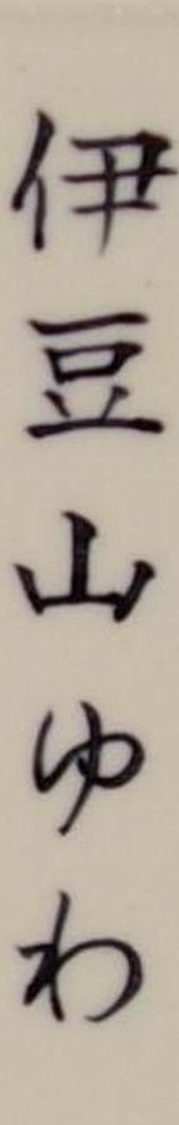伊豆山ゆわ
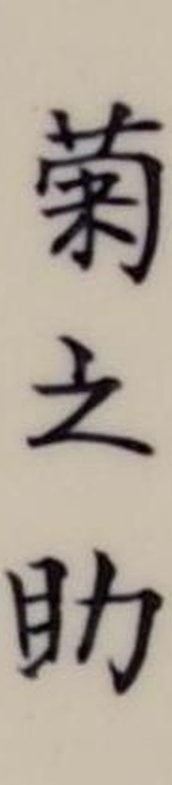菊之助
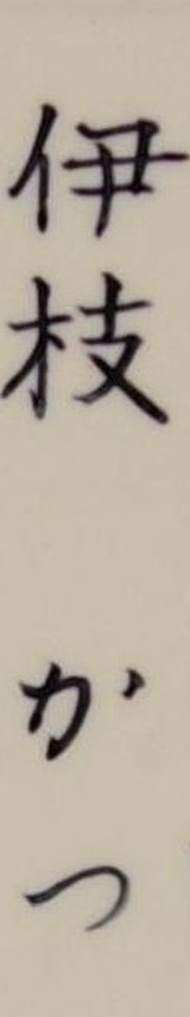伊枝かつ
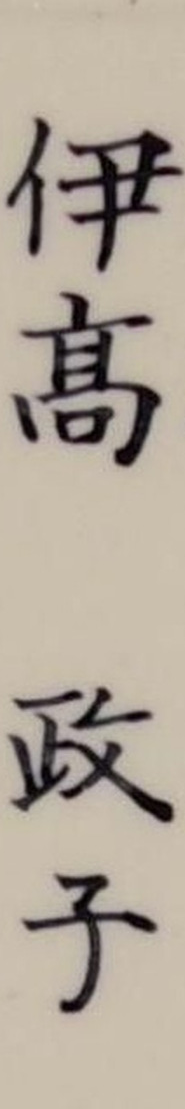伊高政子
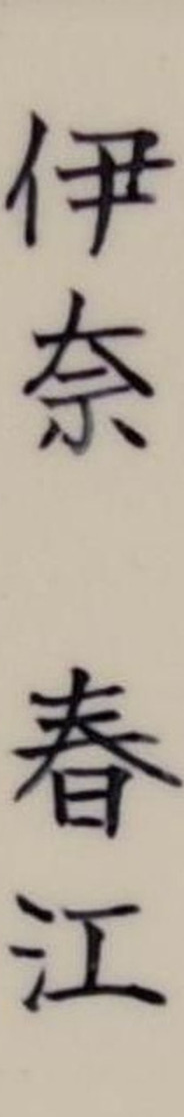伊奈春江
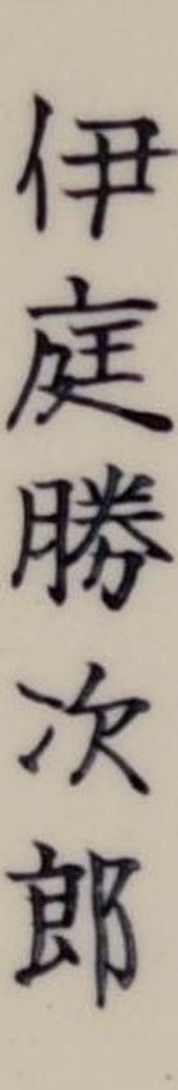伊庭勝次郎
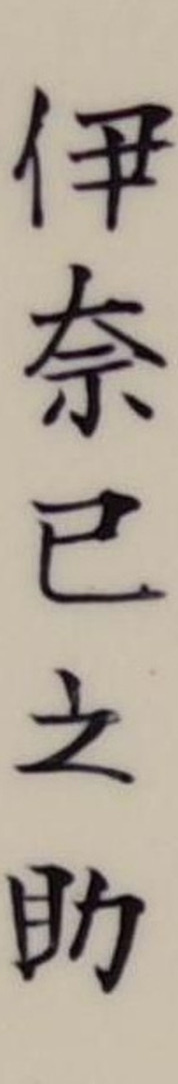伊奈巳之助
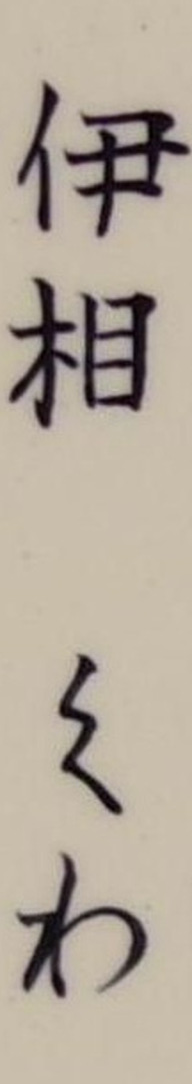伊相くわ
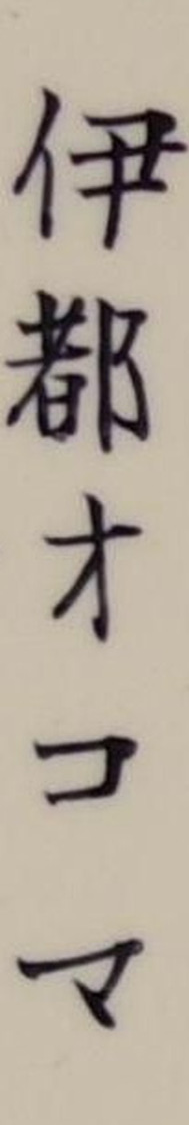伊都オコマ
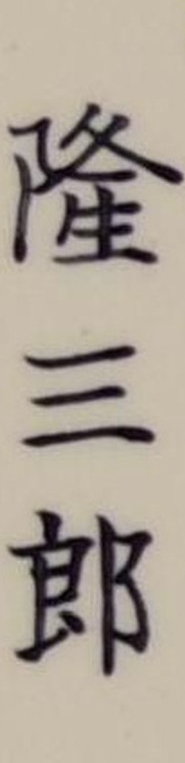隆三郎
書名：M~S
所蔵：高野山金剛峯寺
